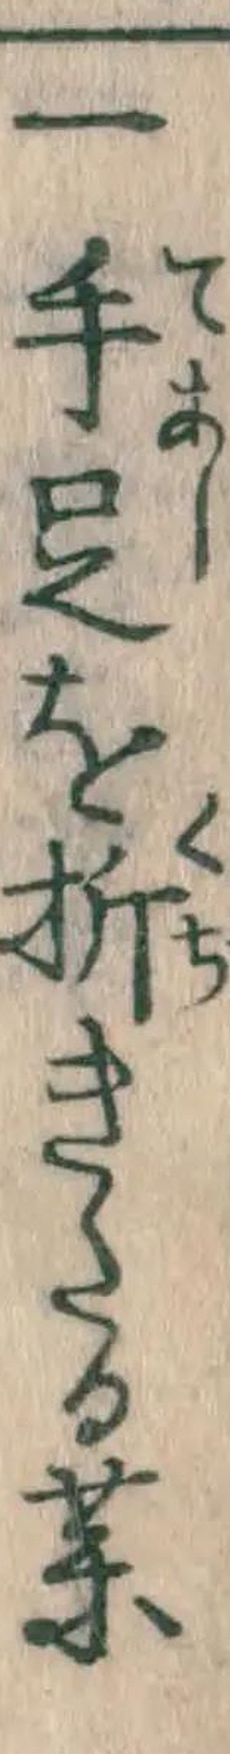一手足を折きたる薬
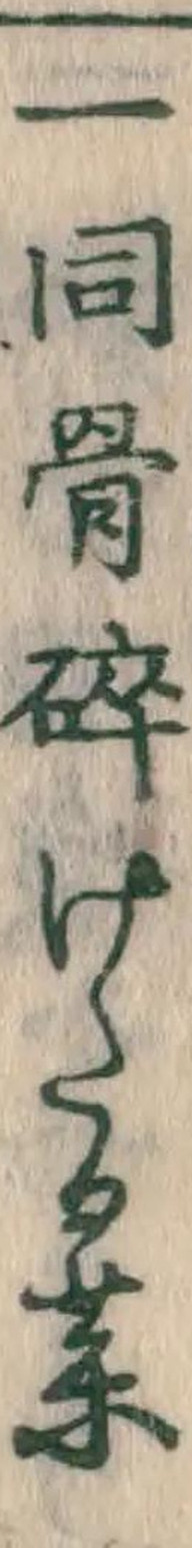一同骨砕けたる薬
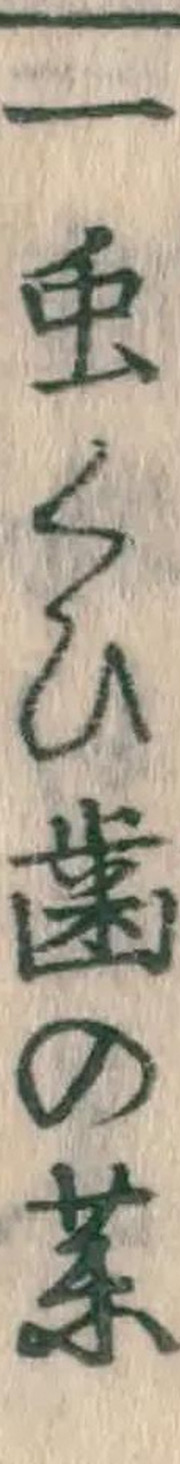一虫くひ歯の薬
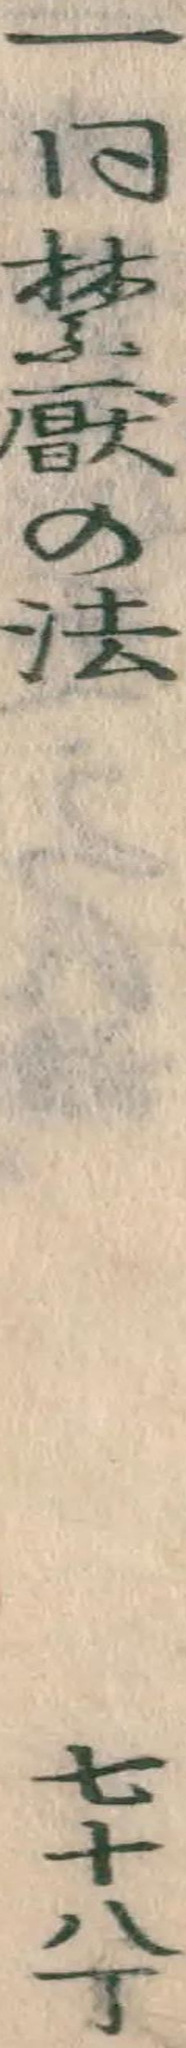一同禁厭の法七十八丁
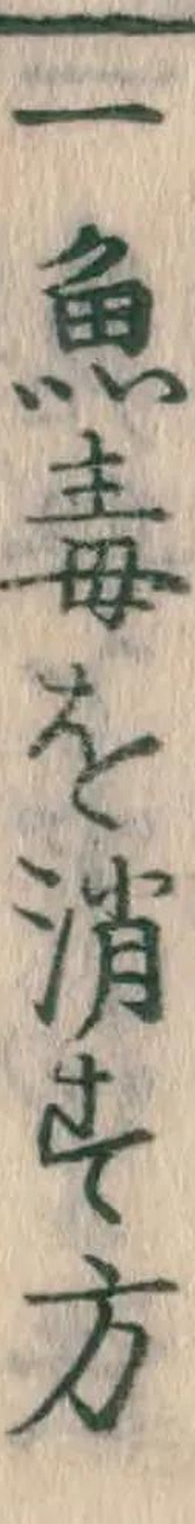一魚毒を消す方
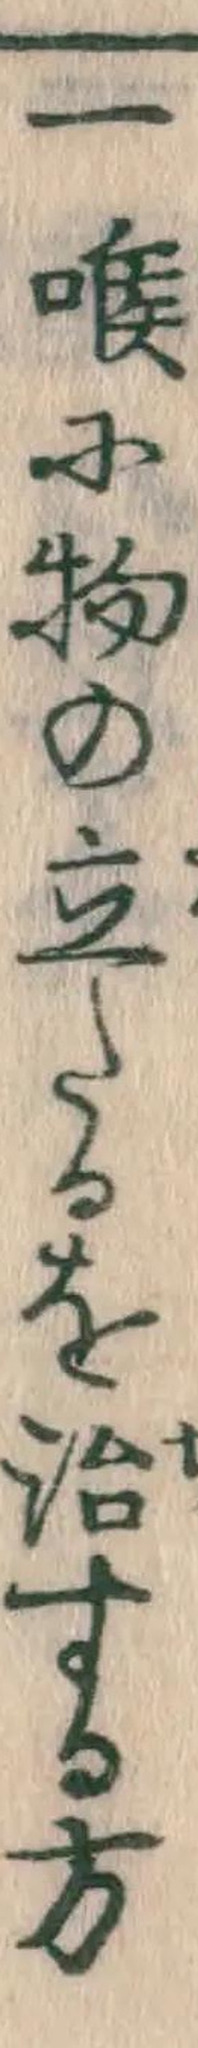一喉に物の立たるを治する方
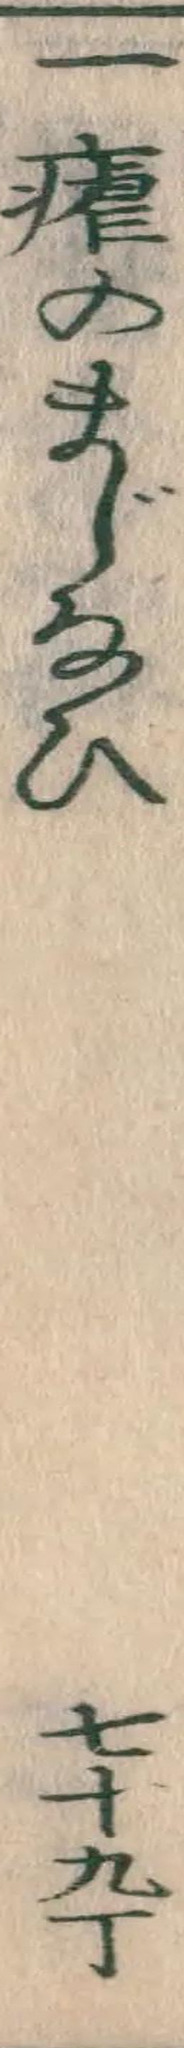一瘧のまじなひ七十九丁
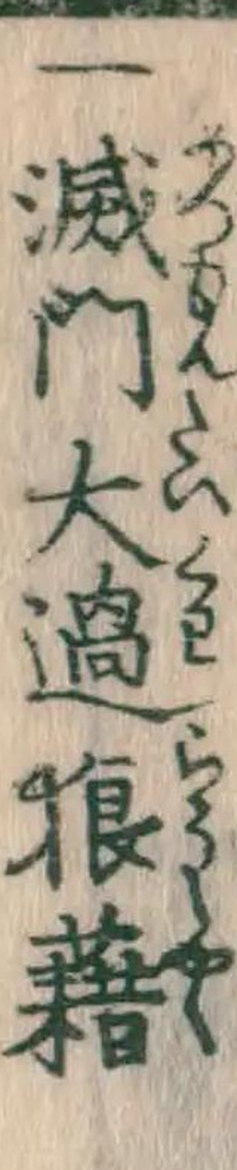一滅門大過狼藉
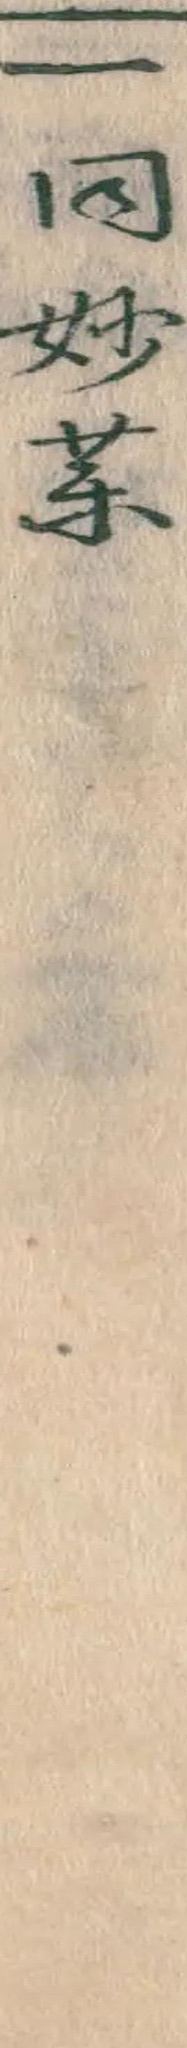一同妙薬
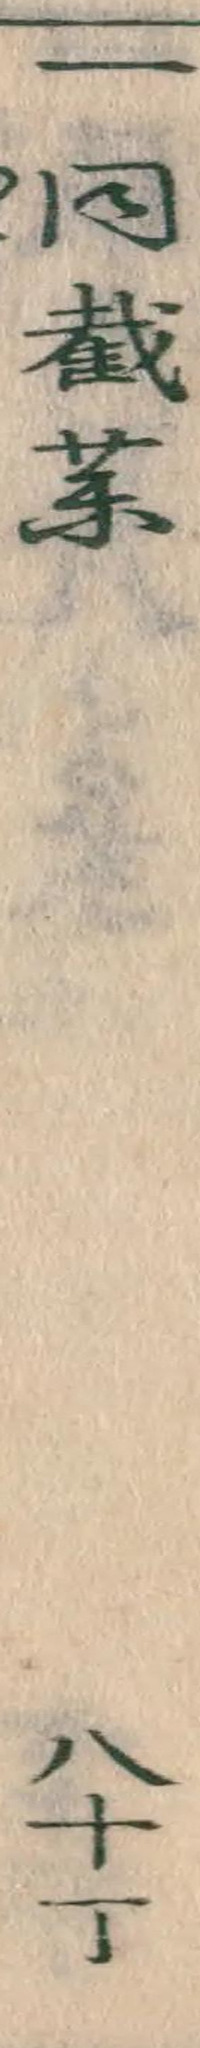一同截薬八十丁
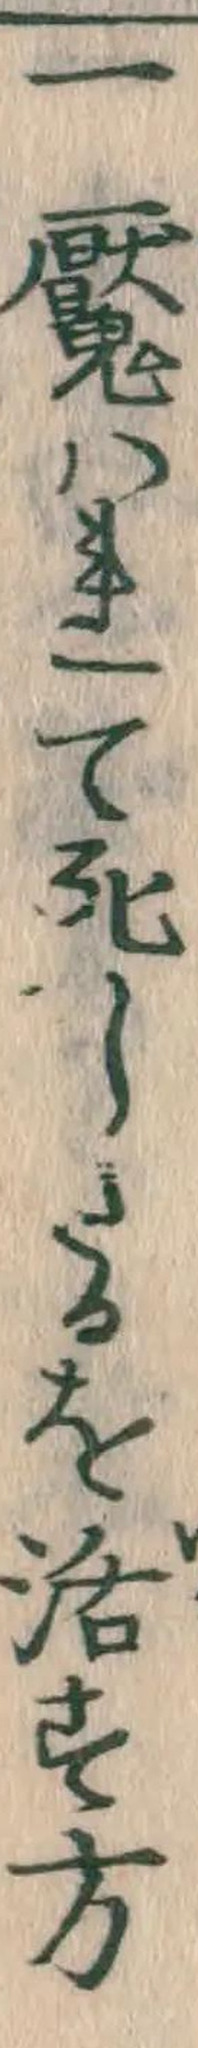一魘はれて死したるを活す方
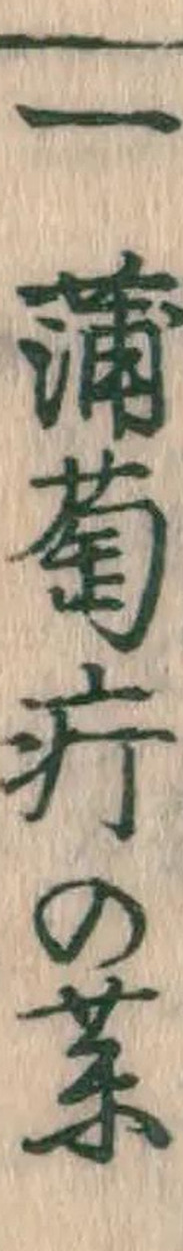一蒲萄疔の薬
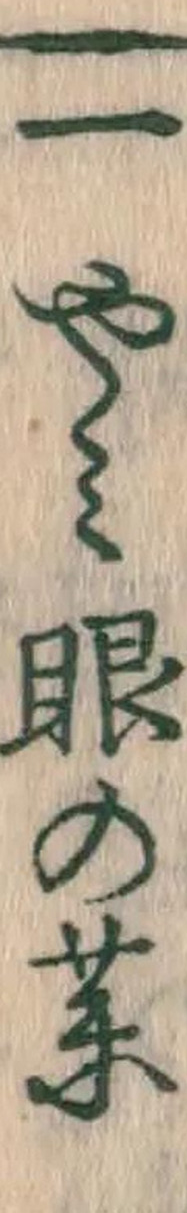一やみ眼の薬
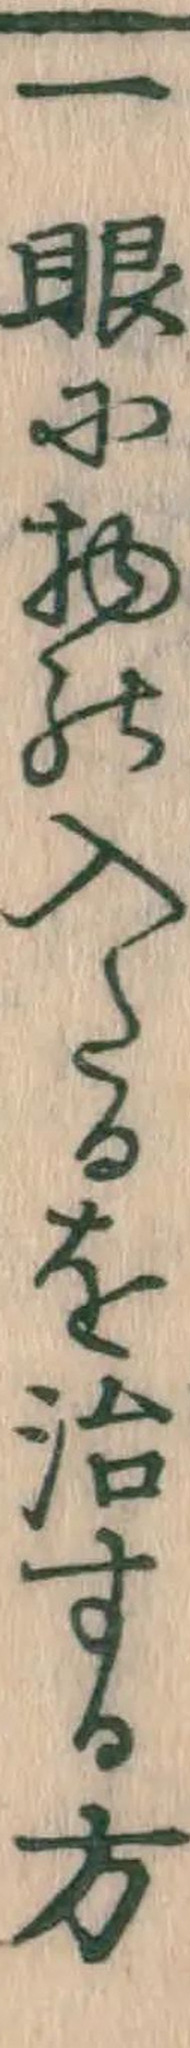一喉に物の立たるを治する方
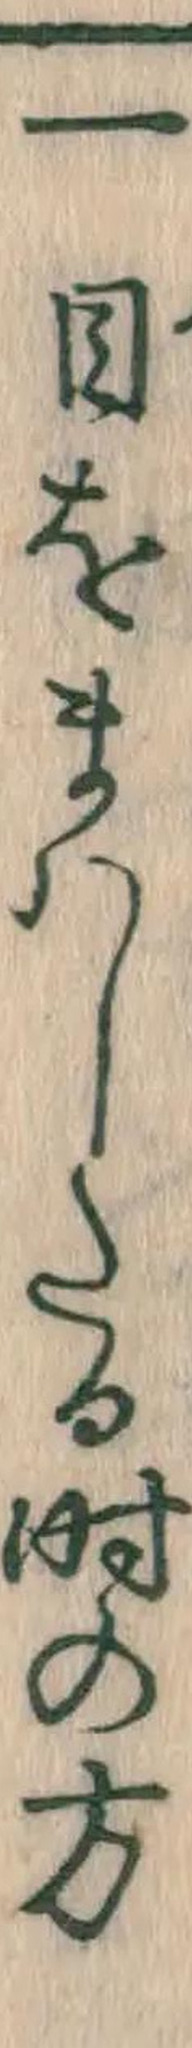一目をまはしたる時の方
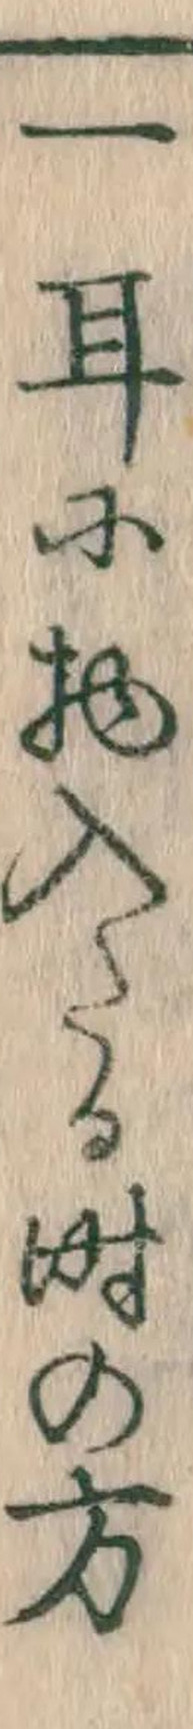一耳に物入たる時の方
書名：広益秘事大全 3巻. [1]
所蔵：国立国会図書館 National Diet Library, JAPAN
